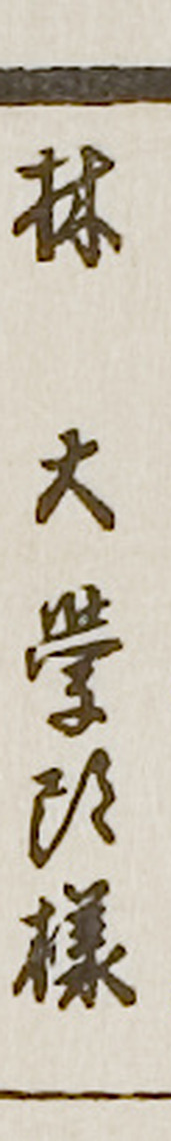林大学頭様
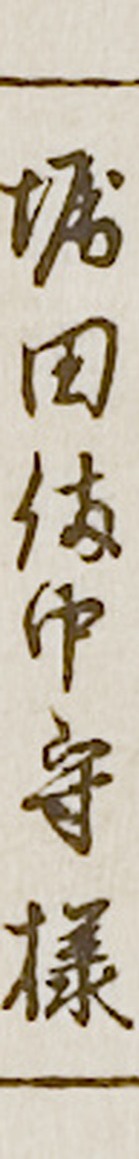堀田備中守様
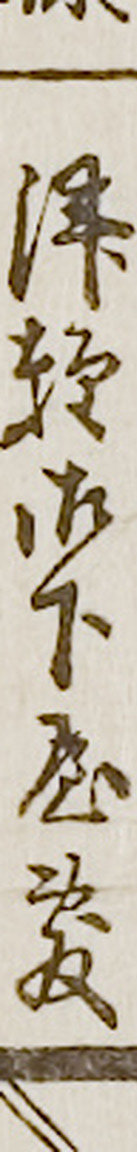津軽御下屋敷
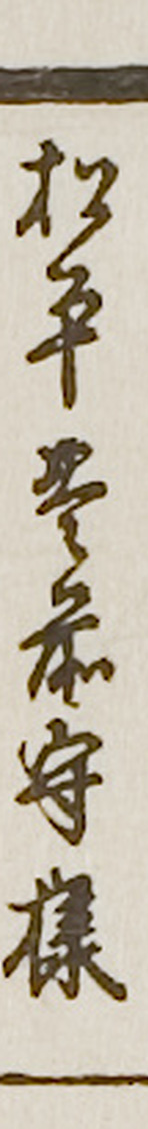松平豊前守様
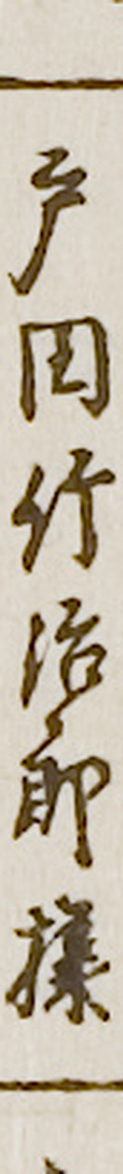戸田竹治郎様
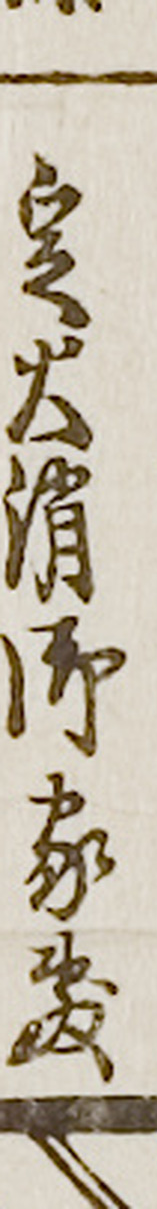定火消御家敷
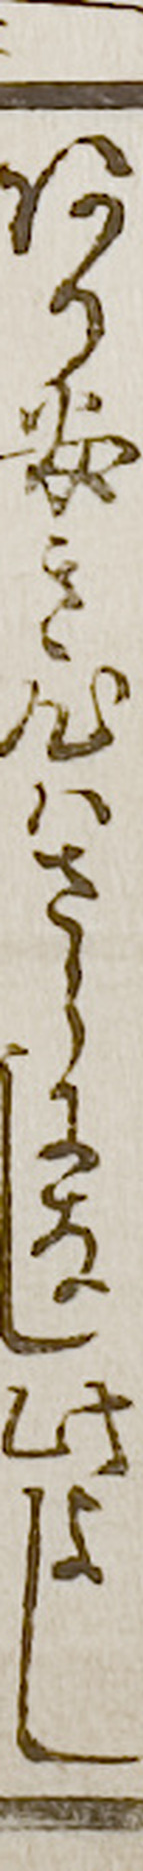あり安き心ハさらになし此よし
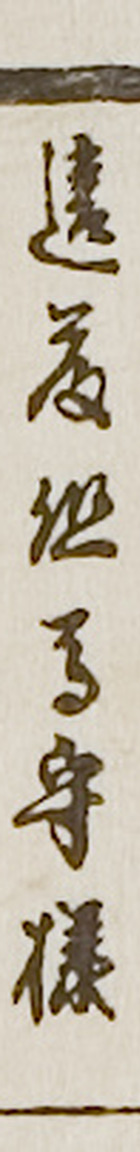遠藤但馬守様
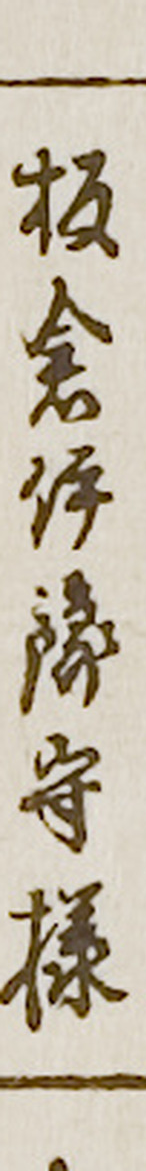板倉伊予守様
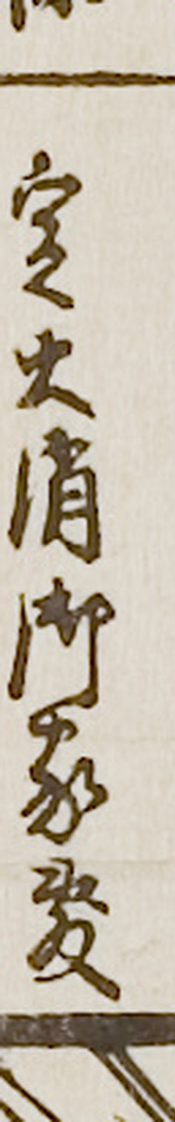定火消御家敷
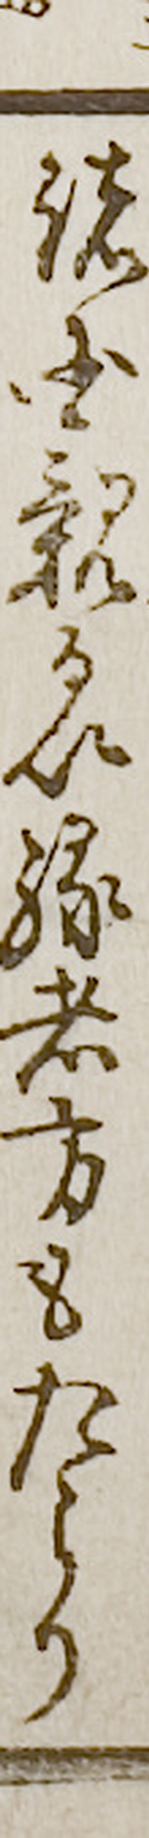諸国親るい縁者方もたより
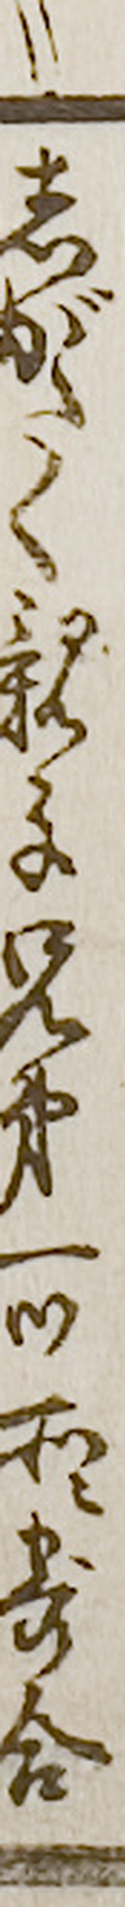しがたく親子兄弟一ツ所ニ寄合
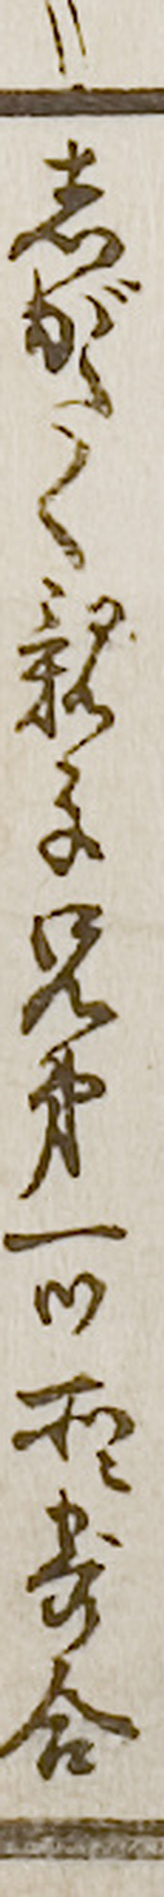しがたく親子兄弟一ツ所ニ寄合
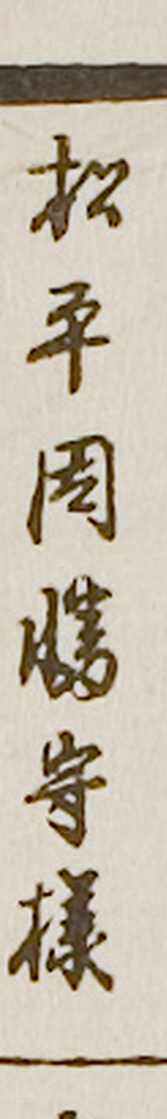松平因幡守様
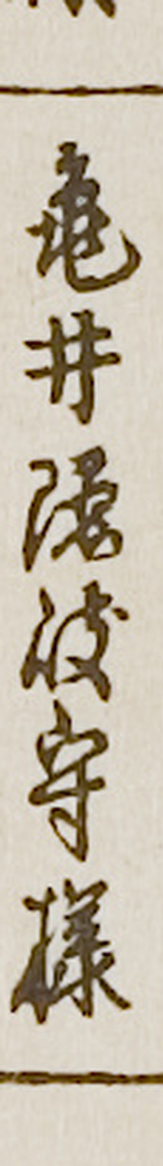亀井隠岐守様
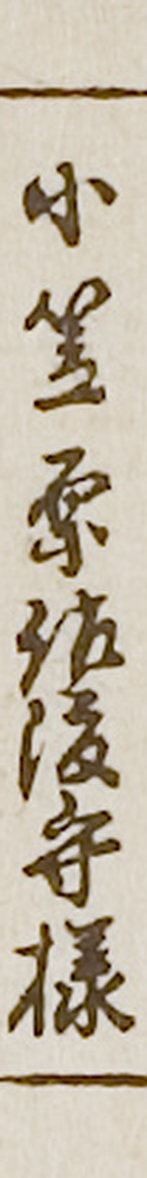小笠原佐渡守様
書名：安政二乙卯歳十月二日夜ル四ツ時震始メ末代
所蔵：東京大学総合図書館 General Library in the University of Tokyo, JAPAN
